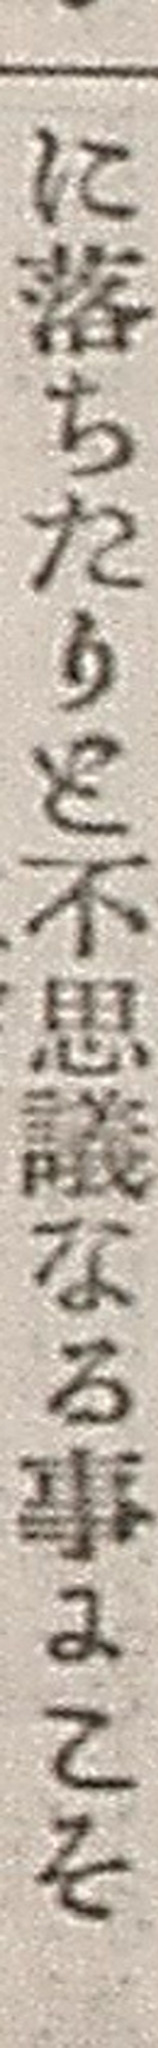に落ちたりと不思議なる事にこそ
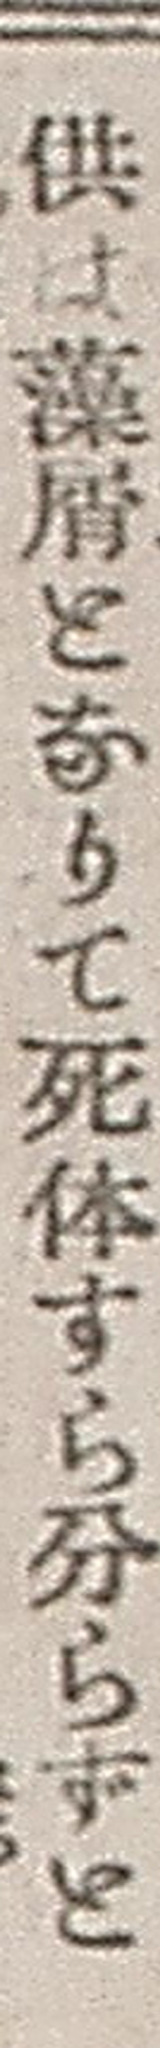供は藻屑となりて死体すら分らずと
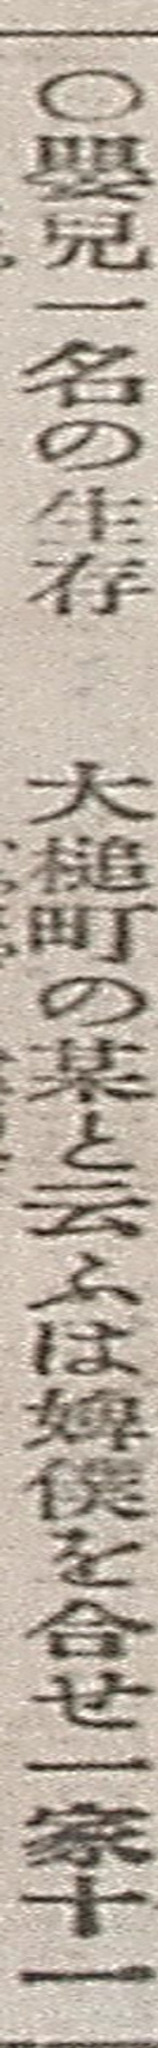○嬰児一名の生存大槌町の某と云ふは婢僕を合せ一家十一
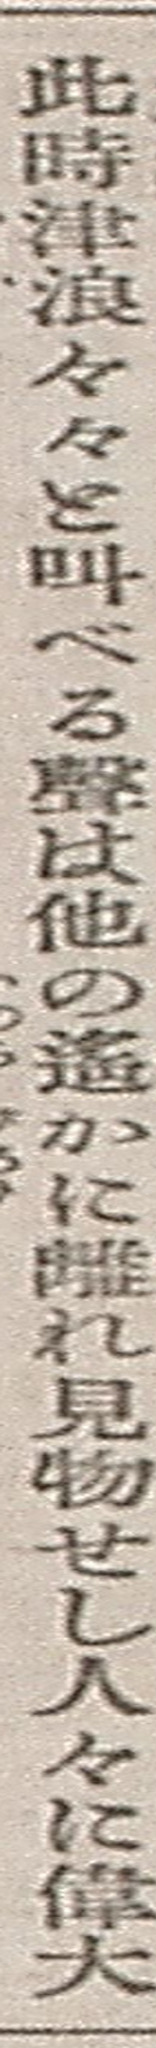此時津浪々々と呼べる声は他の遙かに離れ見物せし人々に偉大
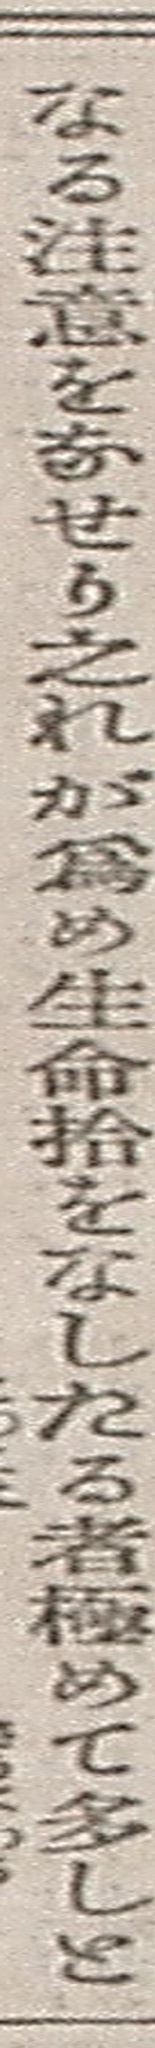なる注意をなせり之れが為め生命拾をなしたる者極めて多しと
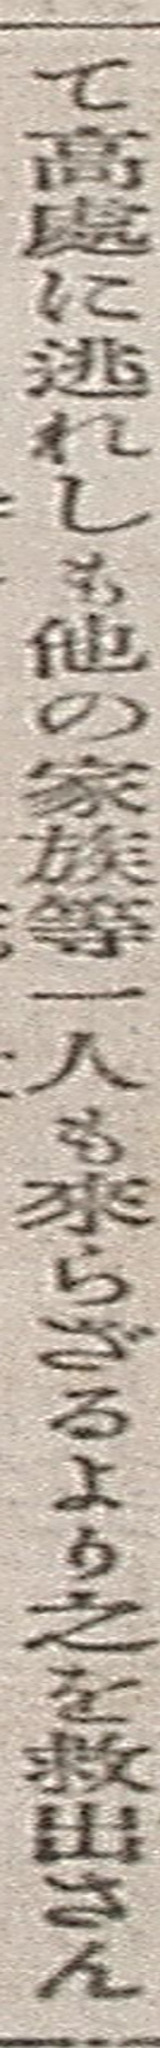て高処に逃れしも他の家族等一人も来らざるより之を救出さん
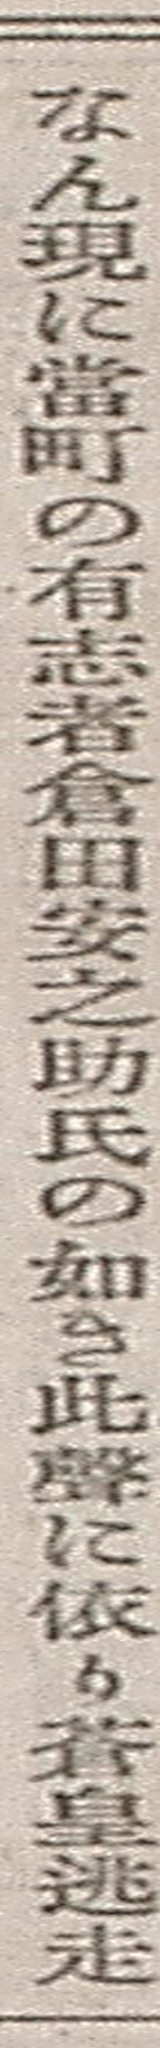なん現に当町の有志者倉田安之助氏の如き此声に依り蒼皇逃走
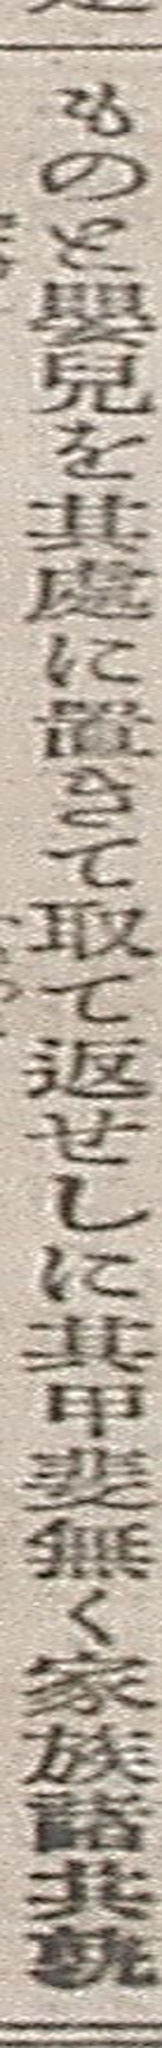ものと嬰児を其処に置きて取て返せしに其甲斐無く家族諸共孰
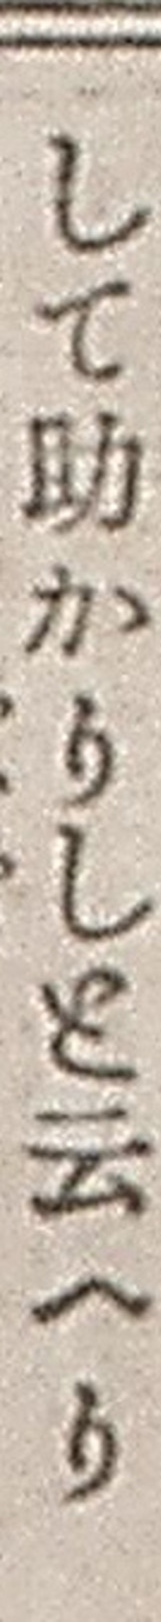して助かりしと云へり
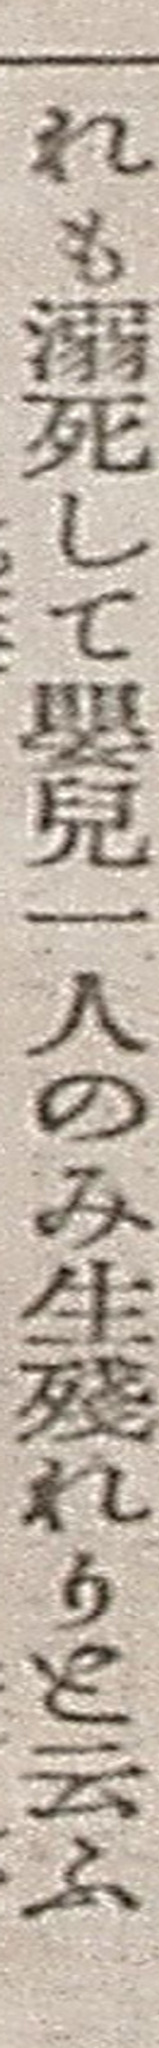れも溺死して嬰児一人のみ生残れりと云ふ
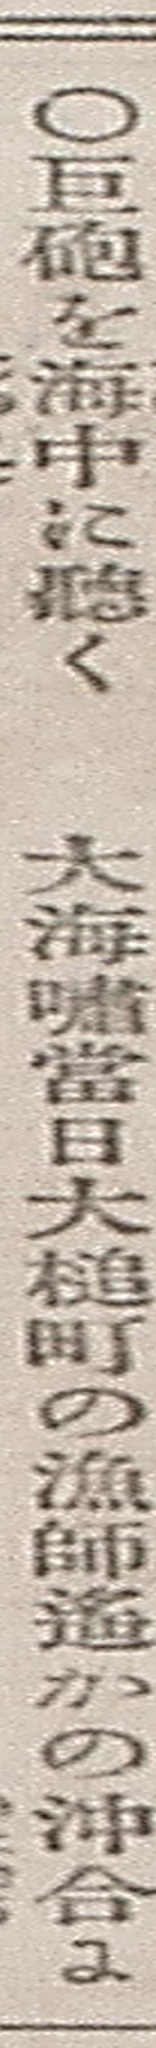○巨砲を海中に聴く大海嘯当日大槌町の漁師遙かの沖合に
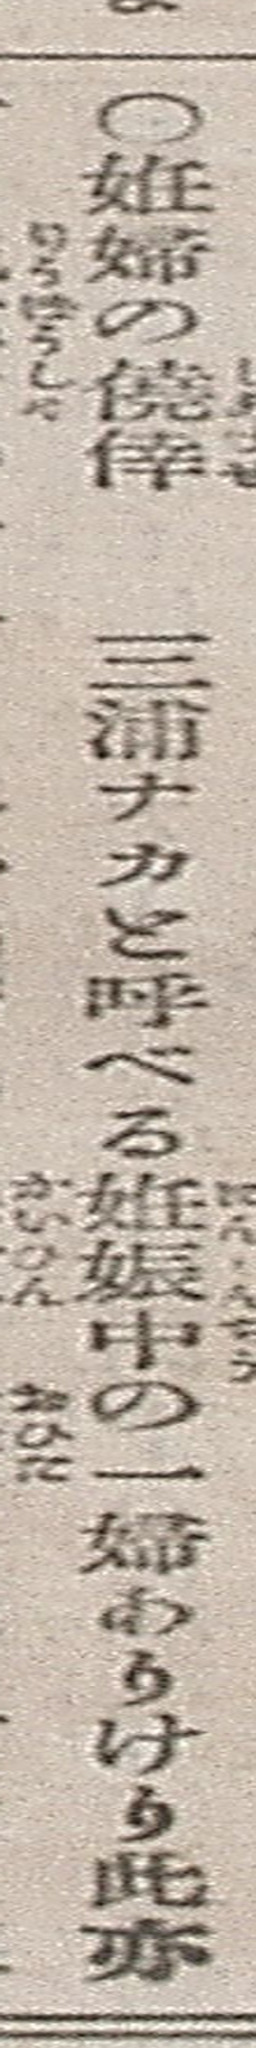○妊婦の僥倖三浦ナカと呼べる妊娠中の一婦ありけり此亦
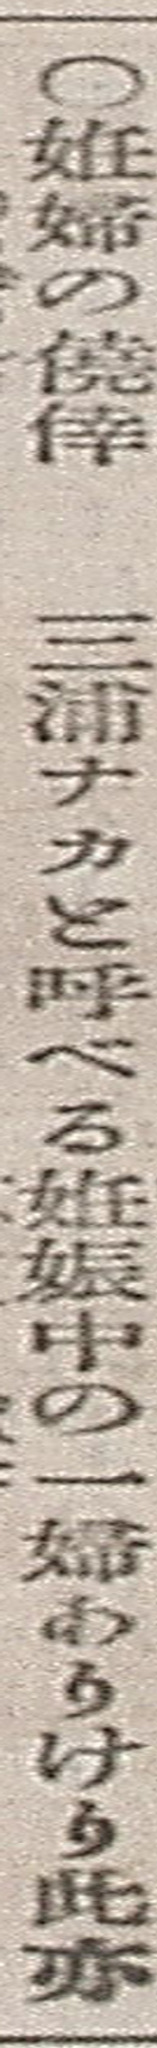○妊婦の僥倖三浦ナカと呼べる妊娠中の一婦ありけり此亦
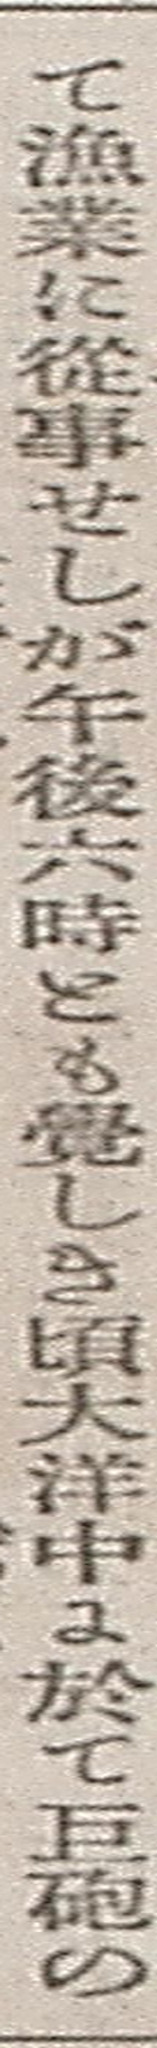て漁業に従事せしが午後六時とも覚しき頃大洋中に於て巨砲の
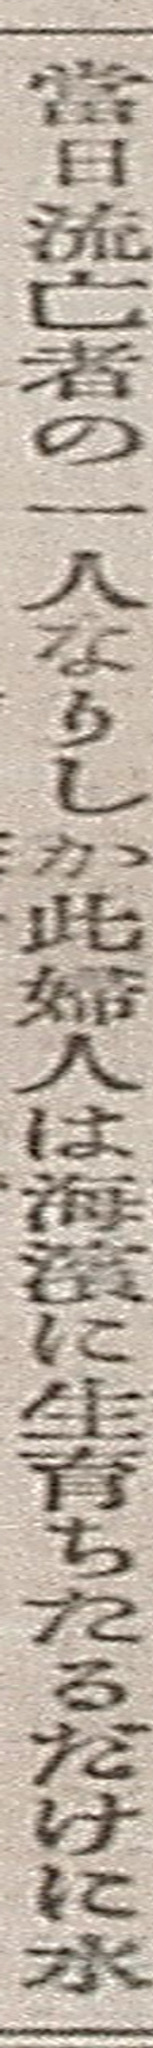当日流亡者の一人なりしか此婦人は海浜に生育ちたるだけに水
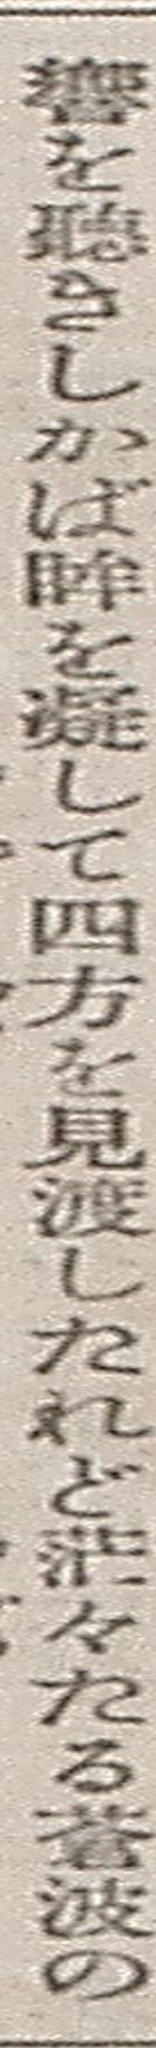響を聴きしかば眸を凝して四方を見渡したれど茫々たる蒼波の
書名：風俗畫報臨時増刊第百十九號　大海嘯被害録（中）
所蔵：東京大学地震研究所図書室 Earthquake Research Institute Library, The University of Tokyo, JAPAN
